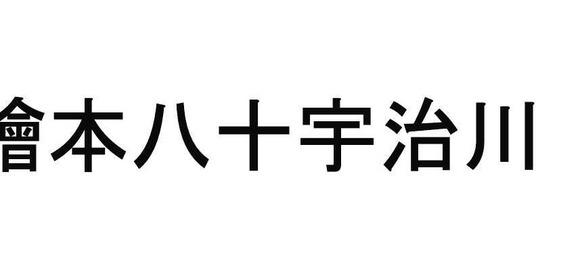絵本八十宇治川
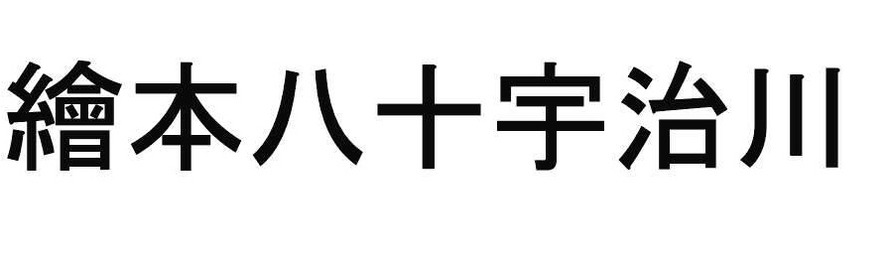絵本八十宇治川

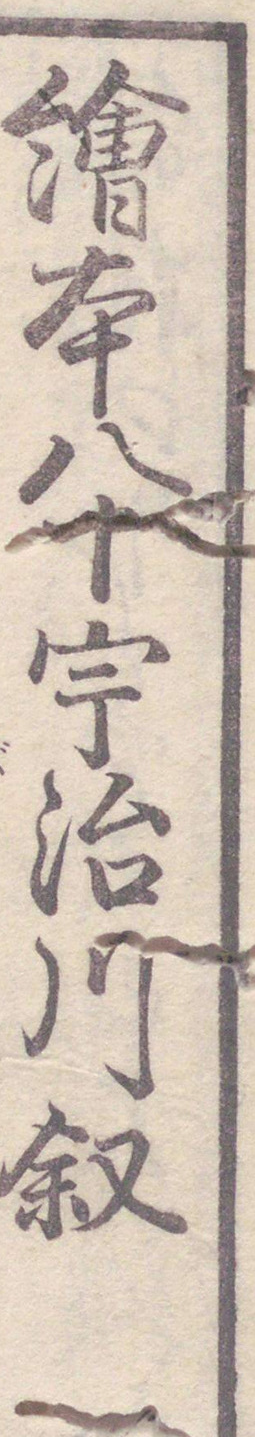絵本八十宇治川叙
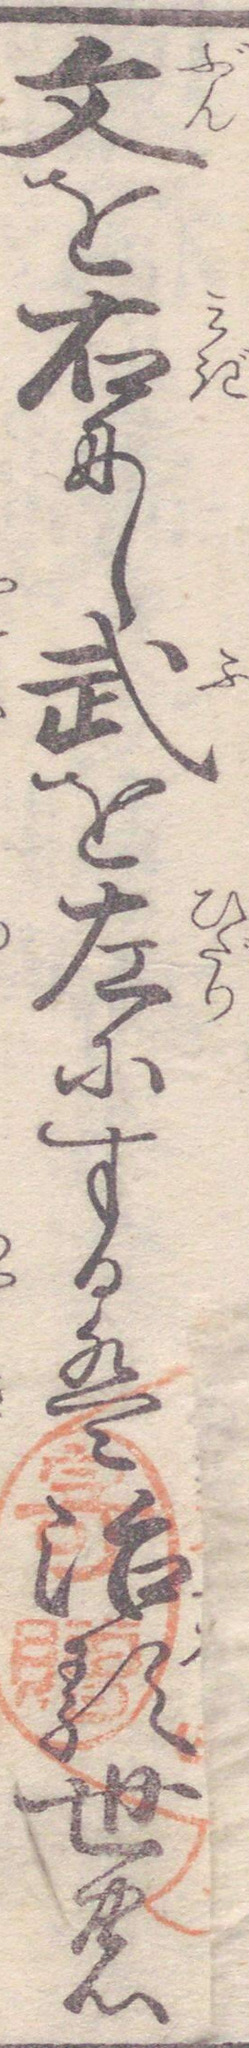文を右にし武を左にするは治る世の
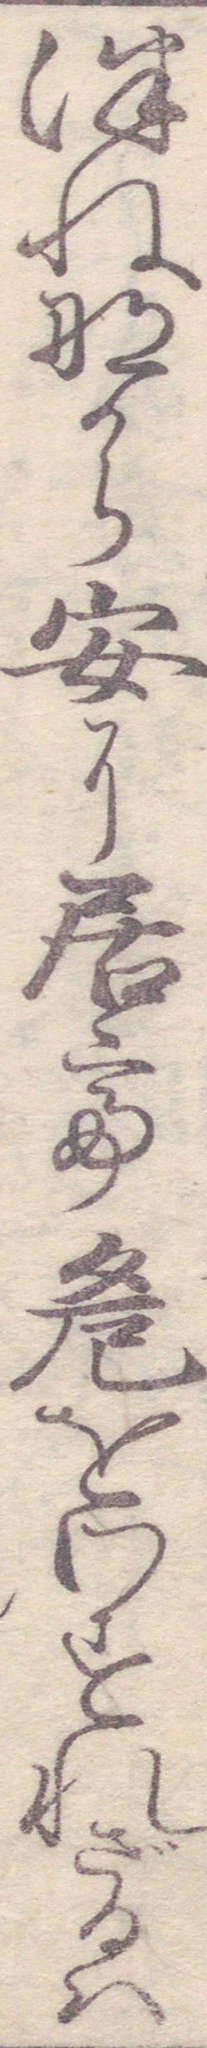つねなから安に居て危をわすれざるは
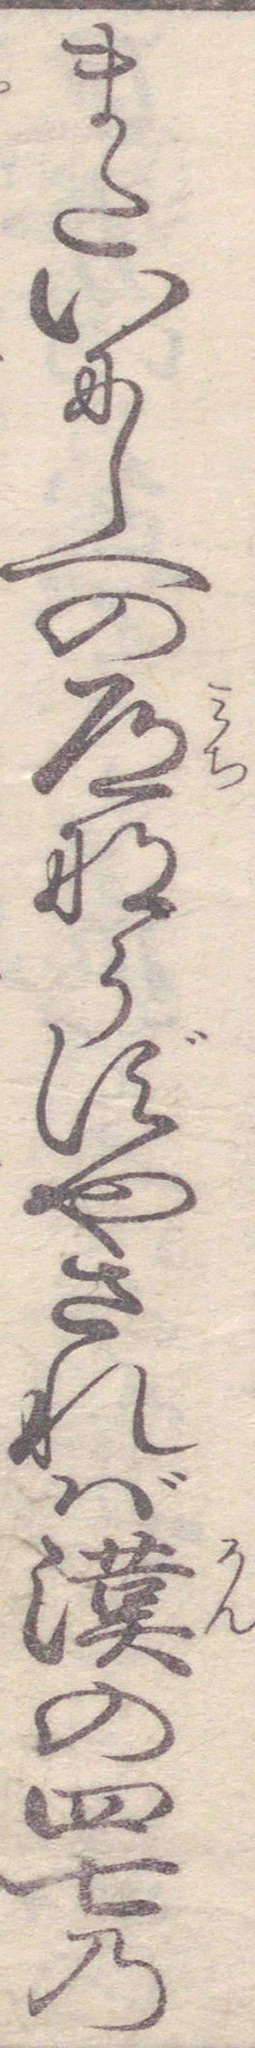またいにしへの道ならずやされば漢の四七の
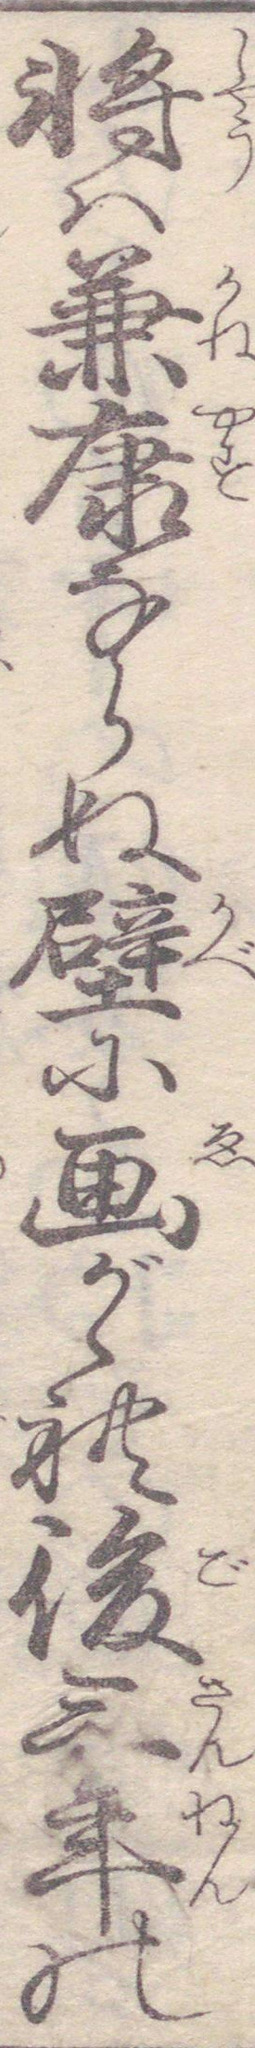将は兼康ならぬ壁に画がゝれ後三年の
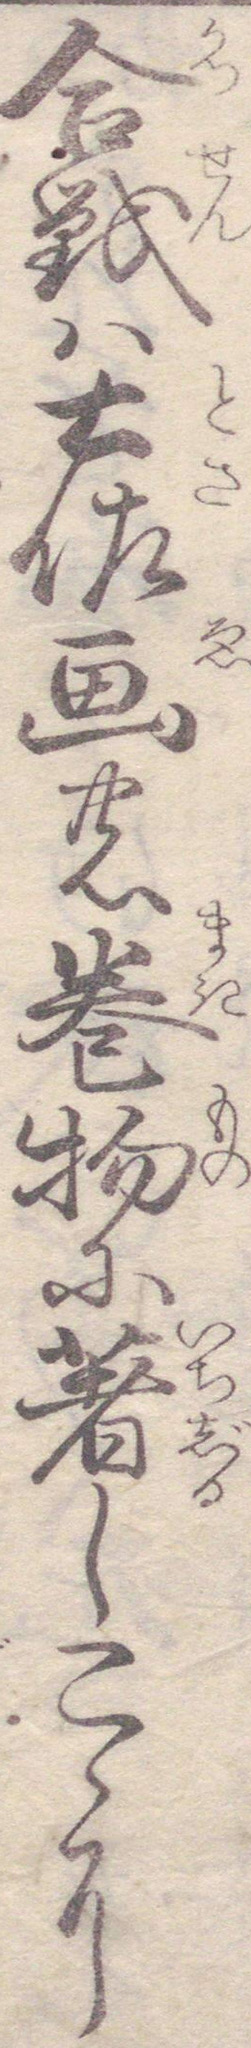合戦は土佐画の巻物に著しこゝに
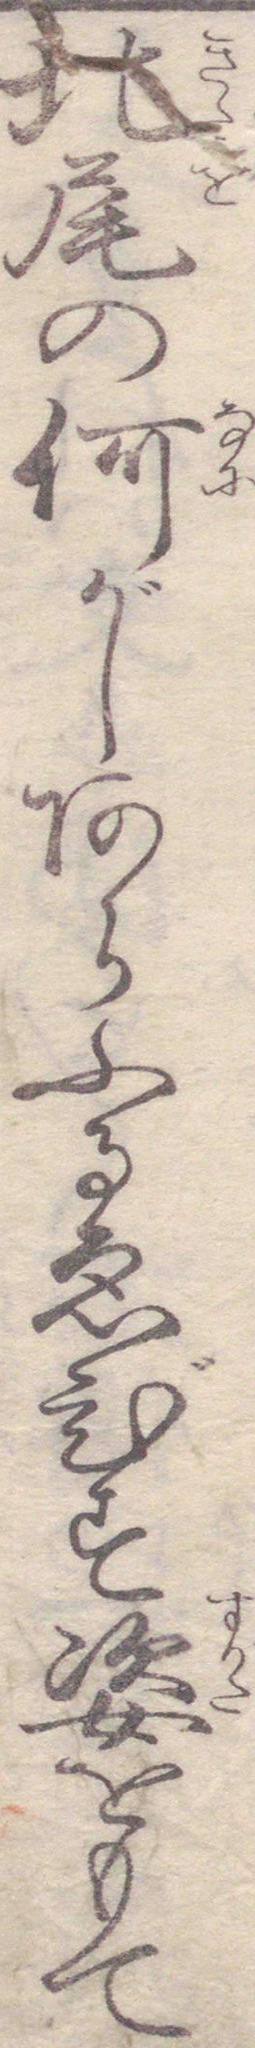北尾の何がしあらふるゑひす姿をもて
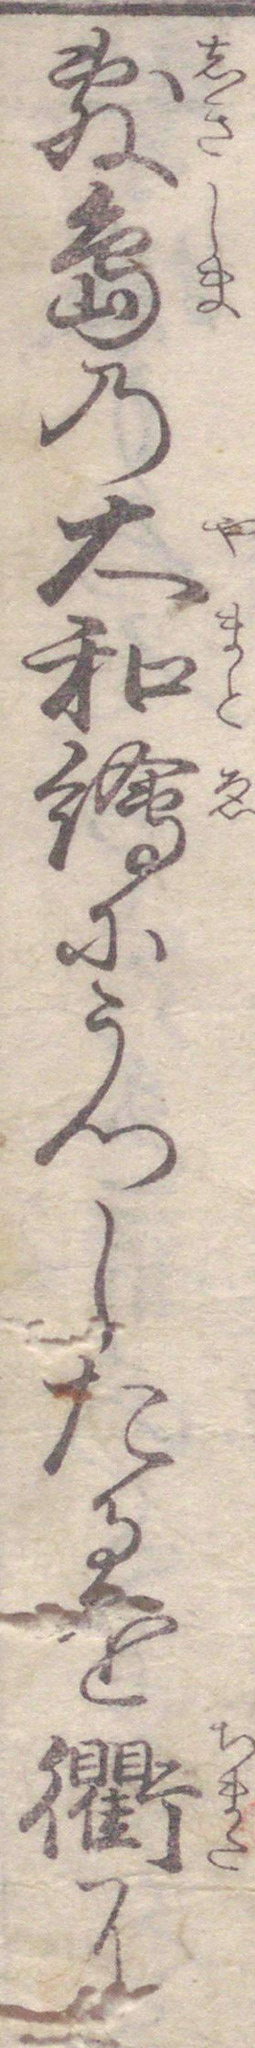敷島の大和絵にうつしたるを衢に

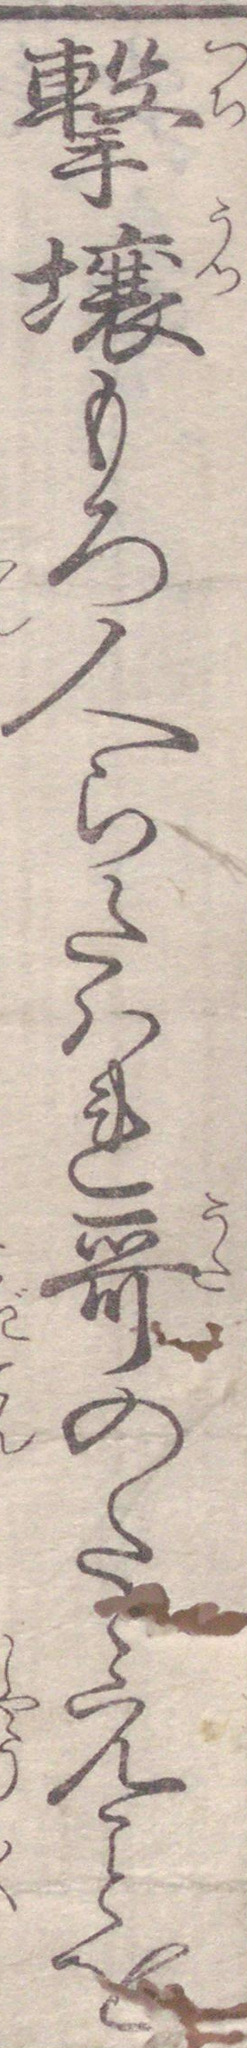撃壌もろ人らたはれ哥のたゝえことを
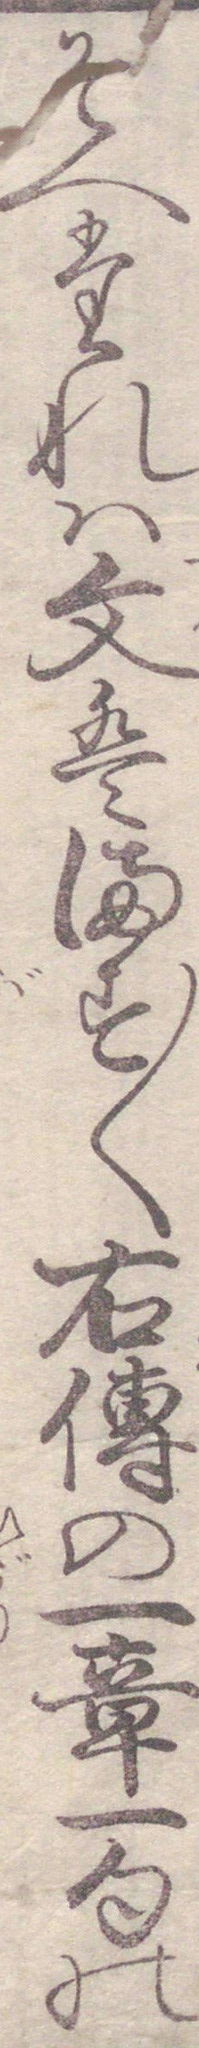そへたれは文はます〳〵右伝の一章一句の
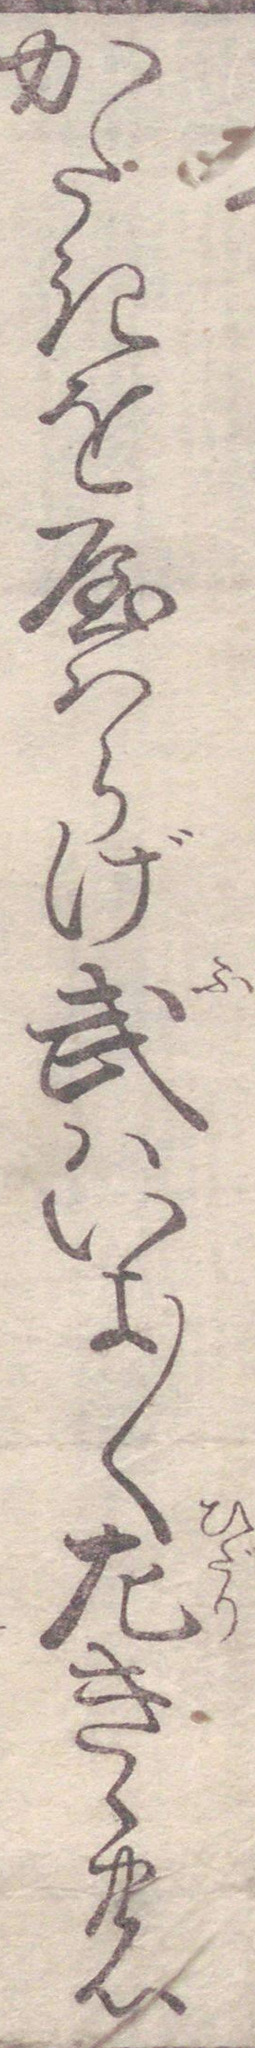かたきをやはらげ武はいよ〳〵左きゝの
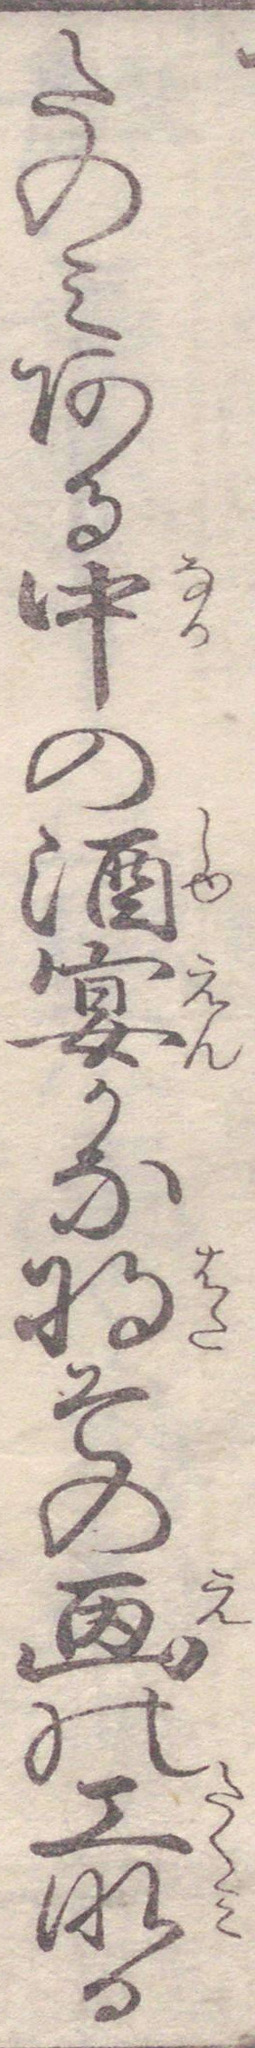たのみある中の酒宴かな将その画の工なる
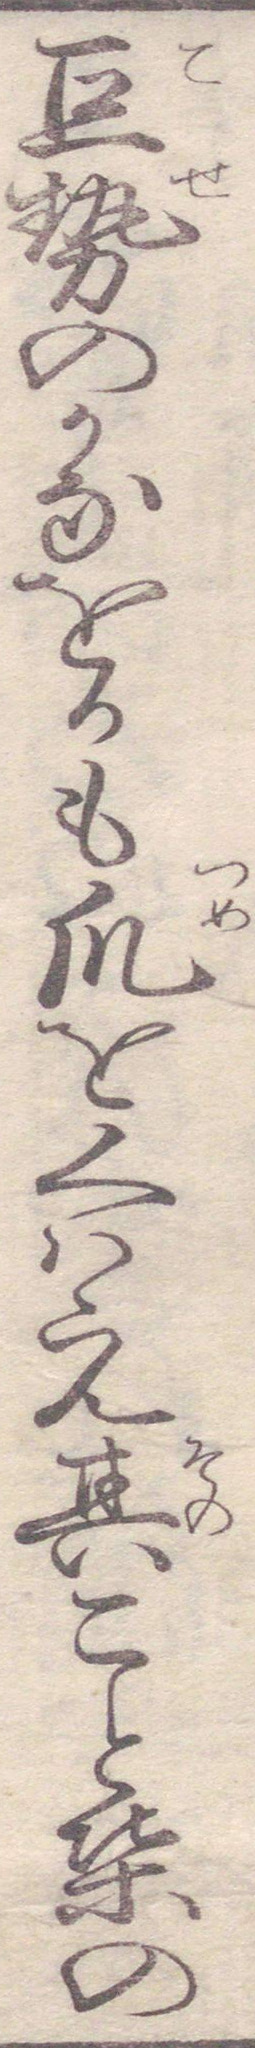巨勢のかなをかも爪をくはえ其こと葉の
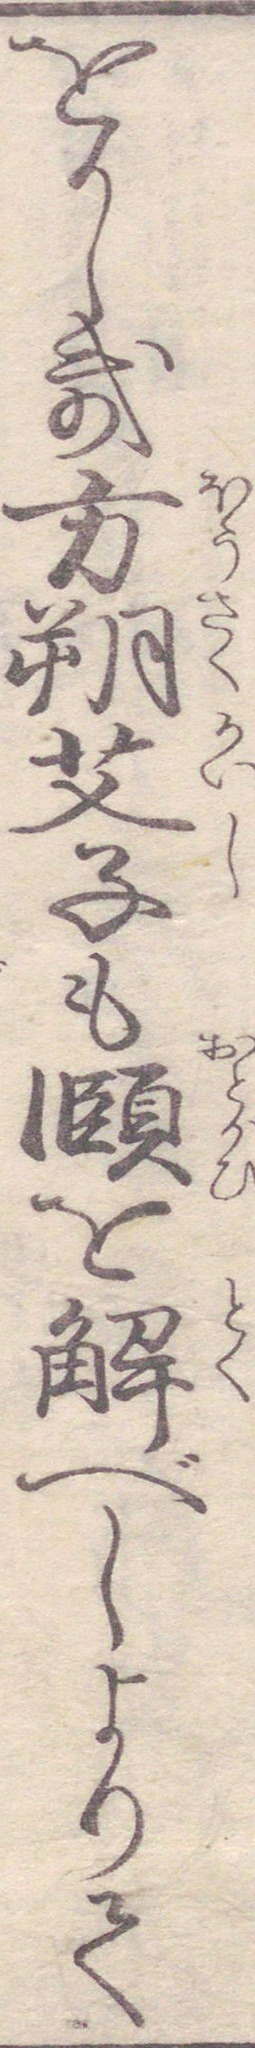をかしき方朔艾子も頤を解べしよりて
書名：繪本八十宇治川
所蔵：九州大学中央図書館 国文学研究資料館
